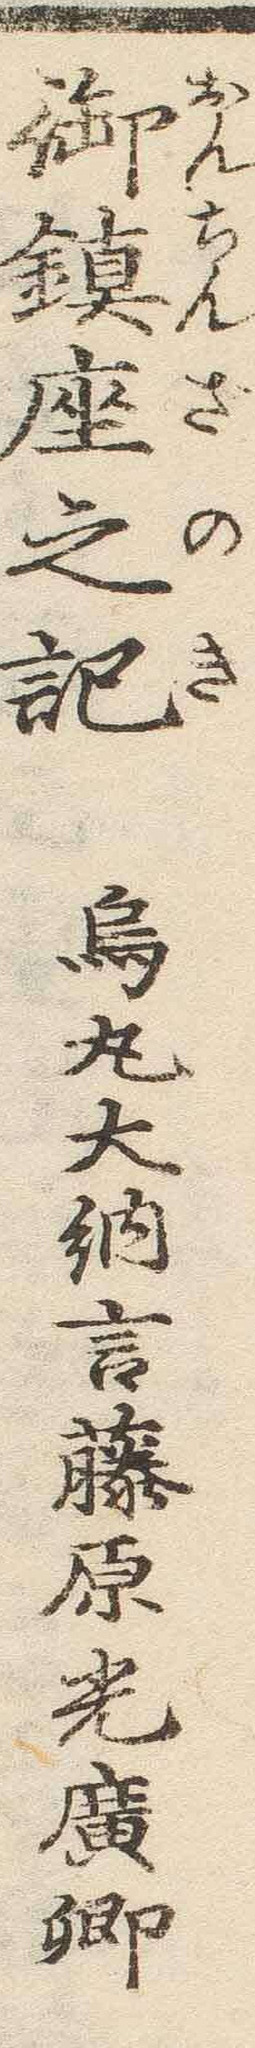御鎮座之記烏丸大納言藤原光廣卿
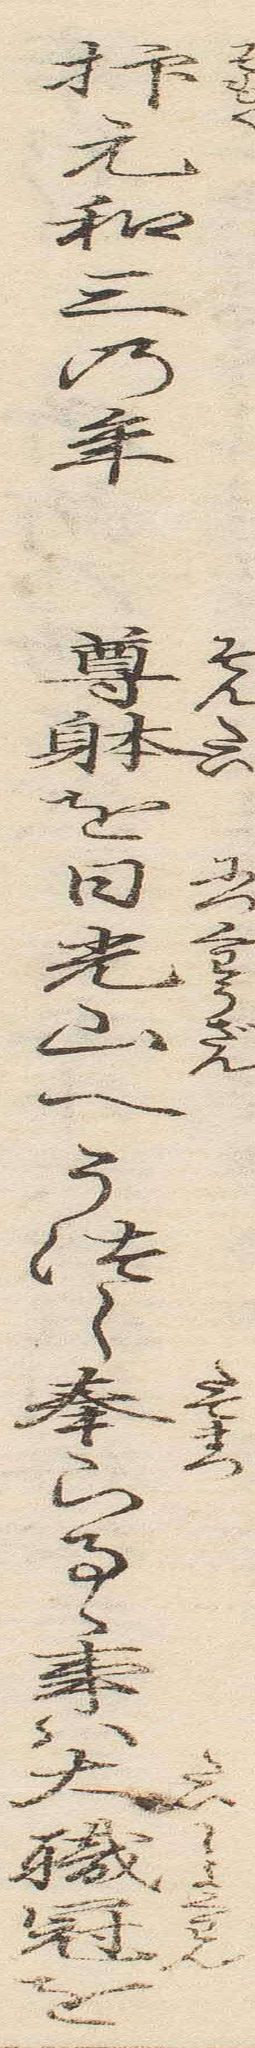抑元和三の年尊躰を日光山へうつし奉らるゝ事は大織冠を
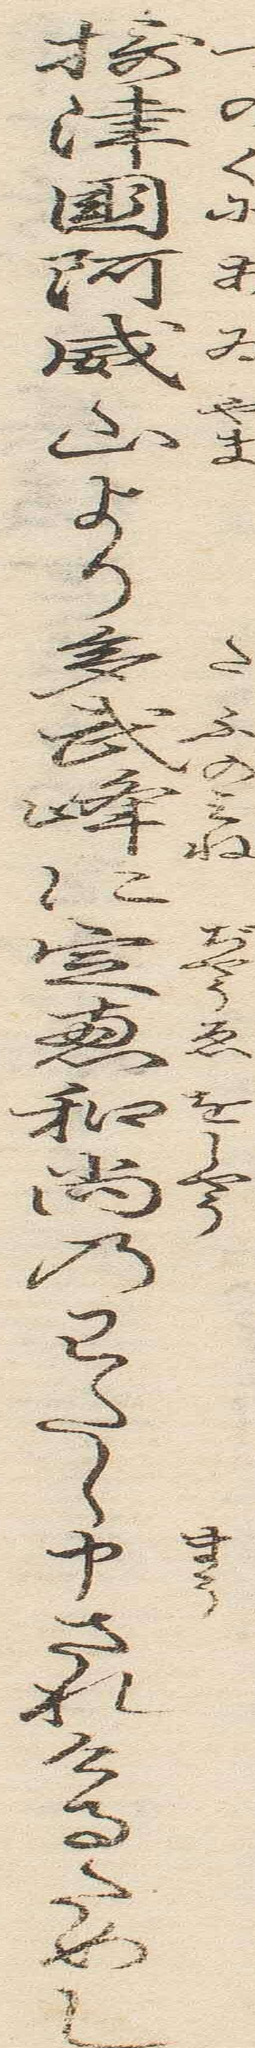摂津國阿威山より多武峰に定惠和尚のわたし申されけるためし
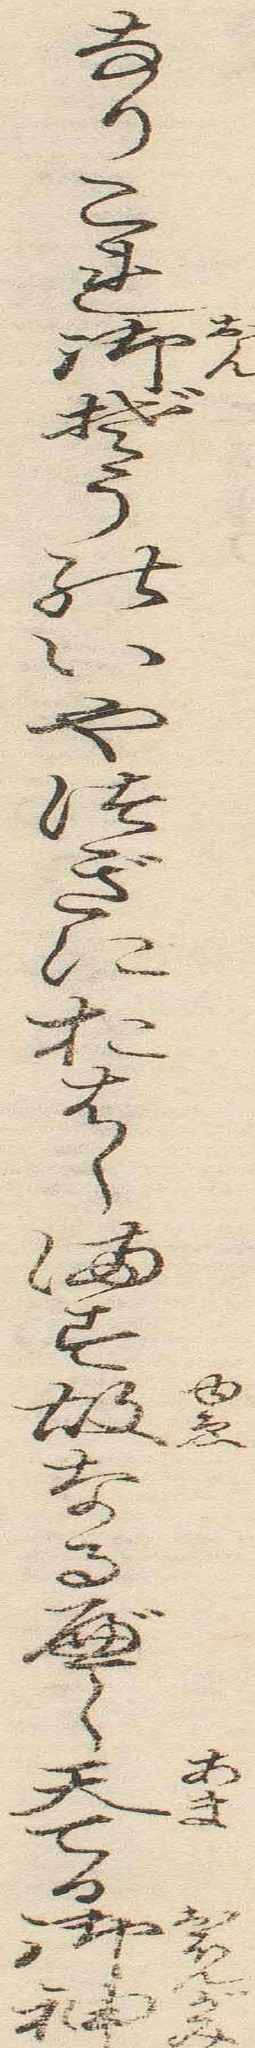なりこれ御ぞうのいやつぎにおはします故なるべし天てる御神
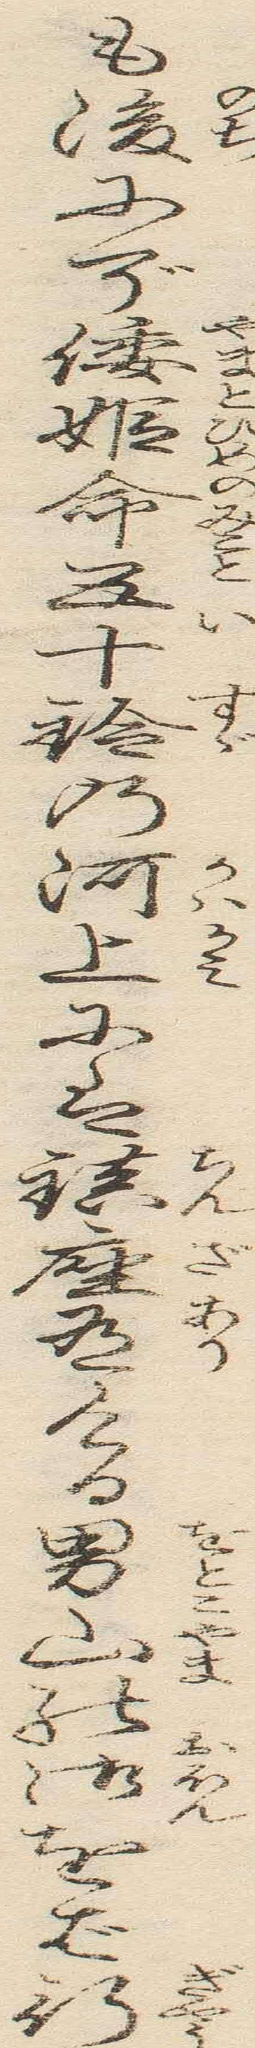も後にぞ倭姫命五十鈴の川上には鎮座有ける男山の御をば行
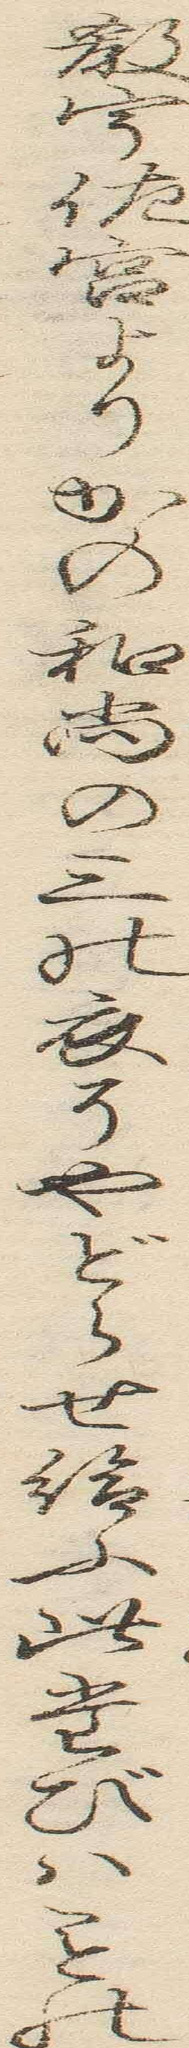敎宇佐宮よりかの和尚の三の衣にやどらせ給ふ此たびはことの
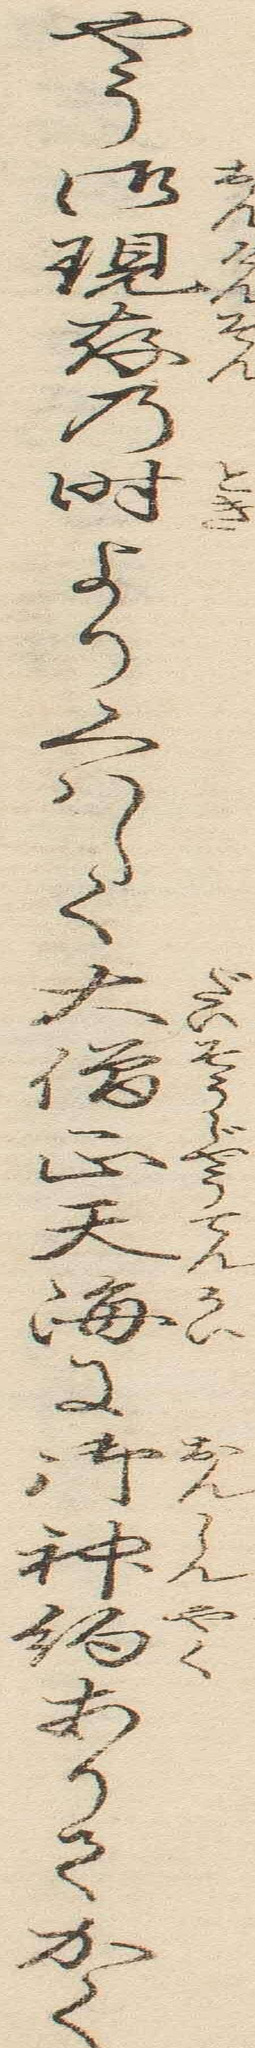やう御現存の时よりくはしく大僧正天海に御神約ありてかく
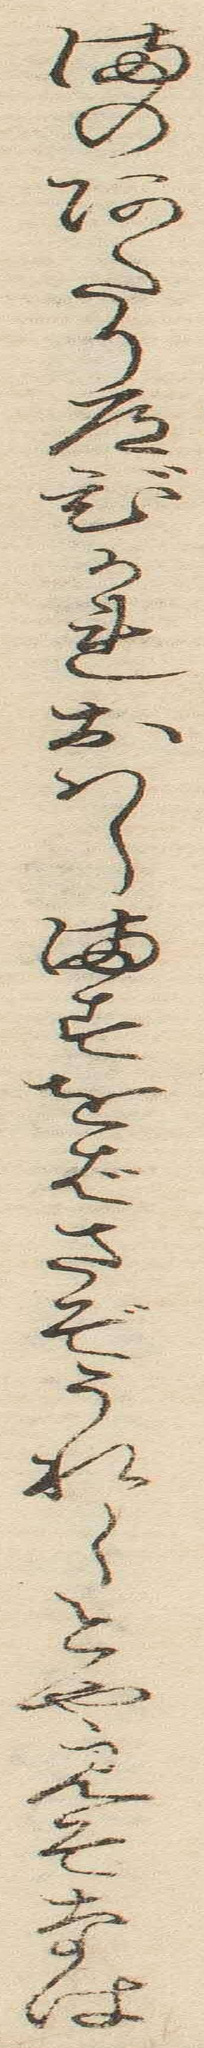まのあたり道びかれおはしますをばさぞうれしとや見そなは
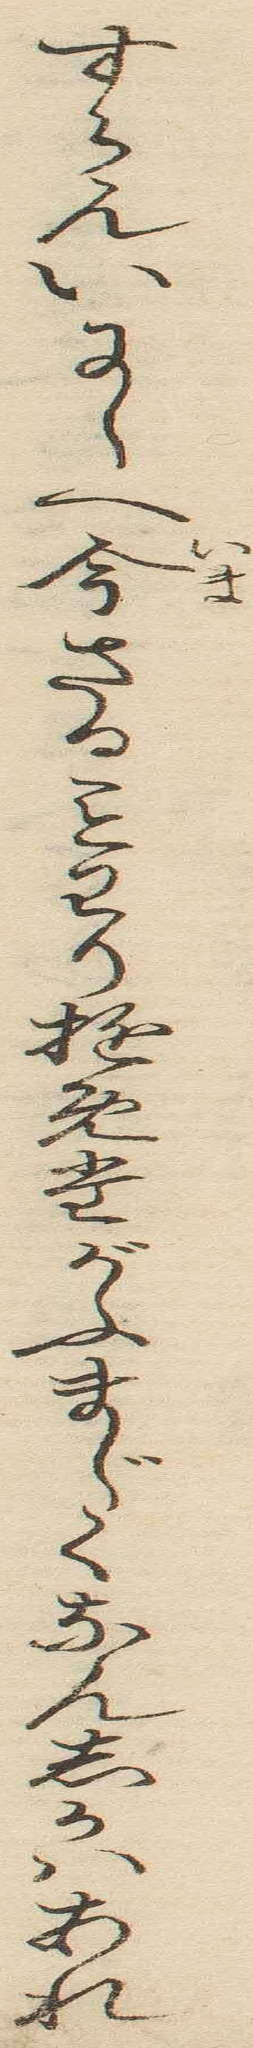すらんいにしへ今さることわり逰めたがふまじくなんしかはあれ

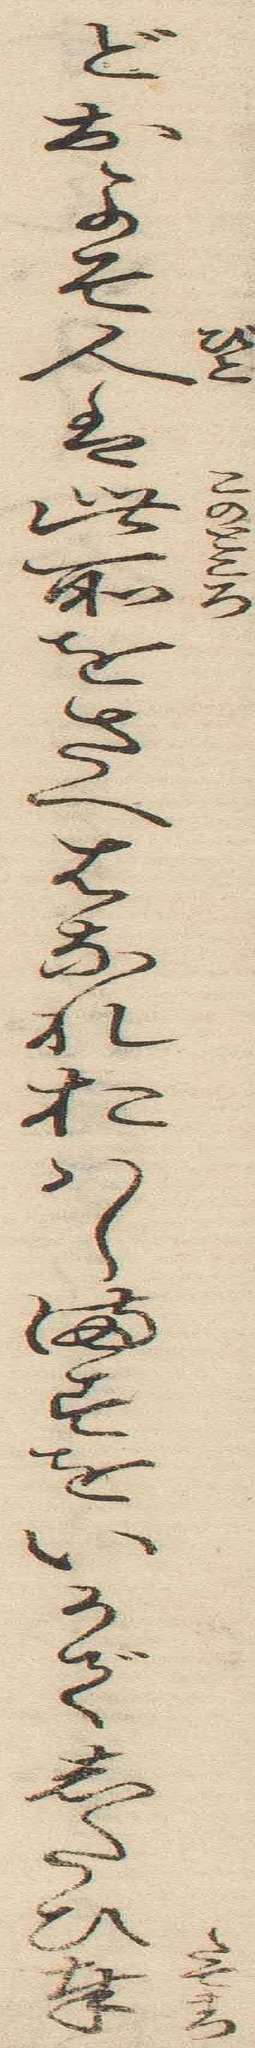どおよそ人は此所をさへはなれおはしますをいかでしたひ奉
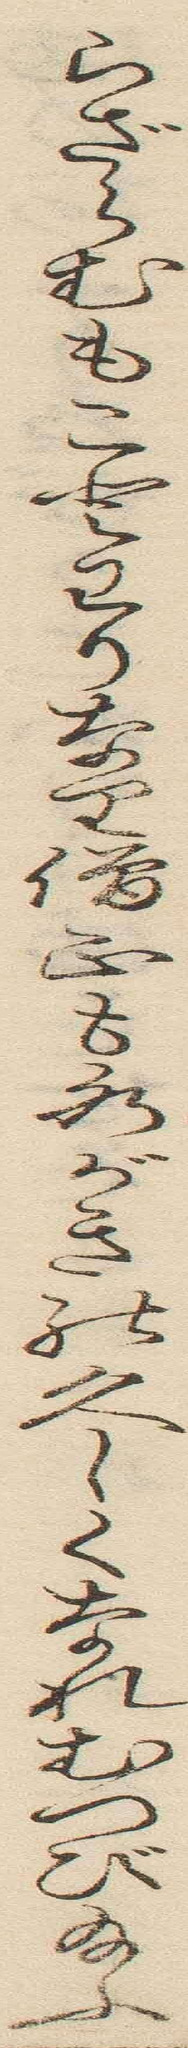らざらむもことわりなり僧正も水がきの久しくなれむつび給ふ
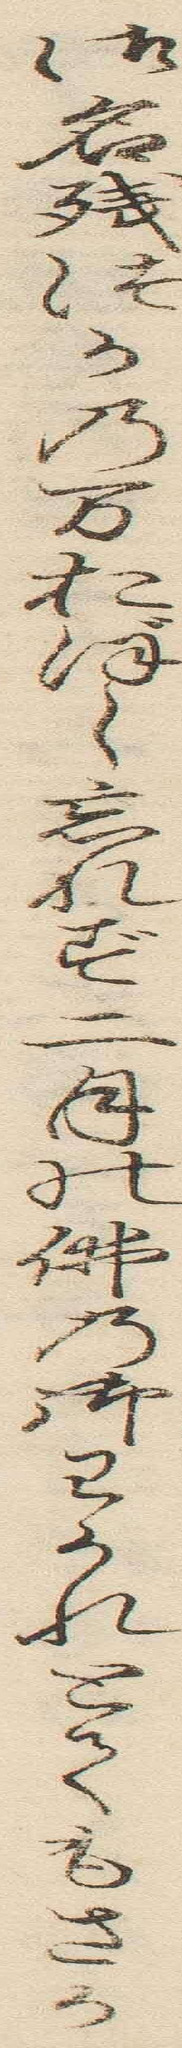御名残つかのまおぼし忘れず二月の佛の御わかれとてもさか
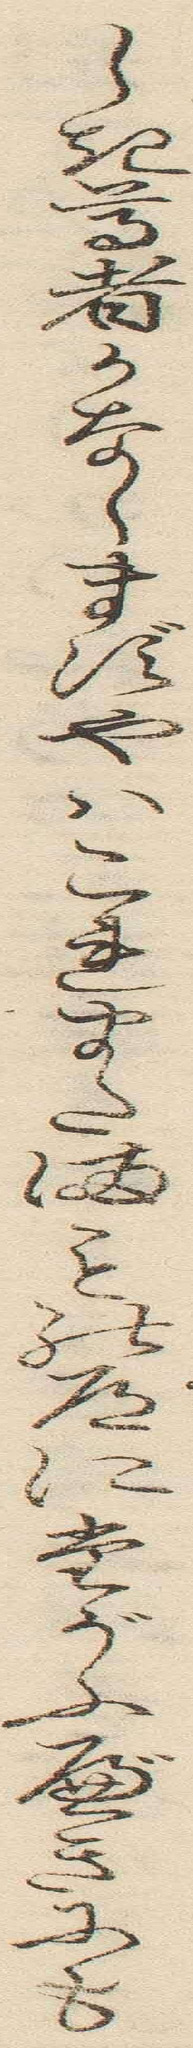しき尊者かなしまずやはこれまたまことの道にたがふべきにも
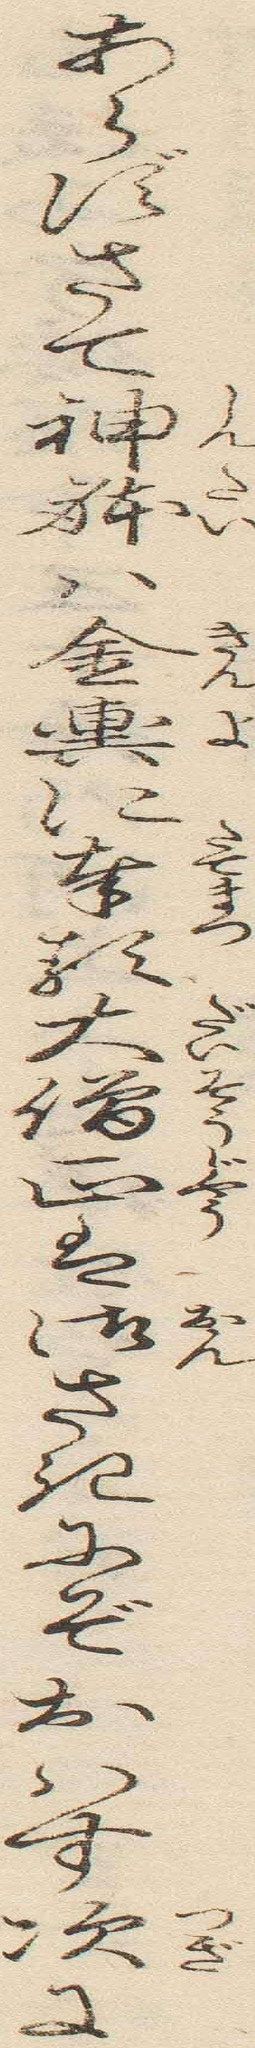あらずさて神躰は金輿に奉る大僧正は御さきにぞおはす次に
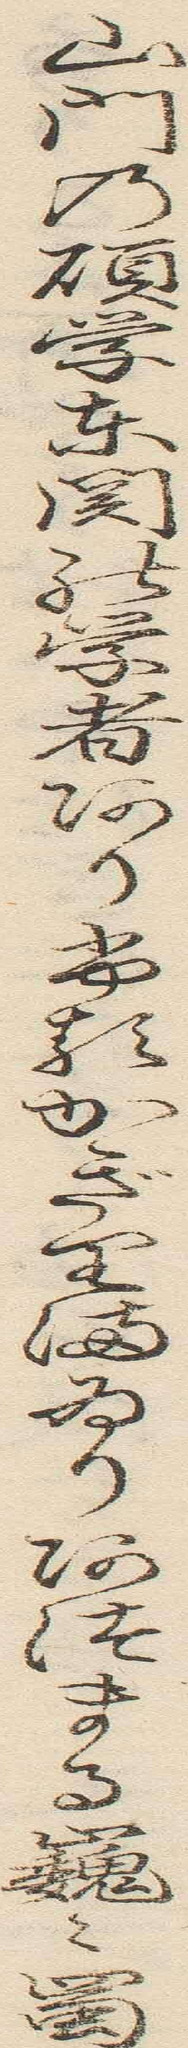山門の碩学東関の学者ありけるかぎりまゐりあつまる巍〻蜀
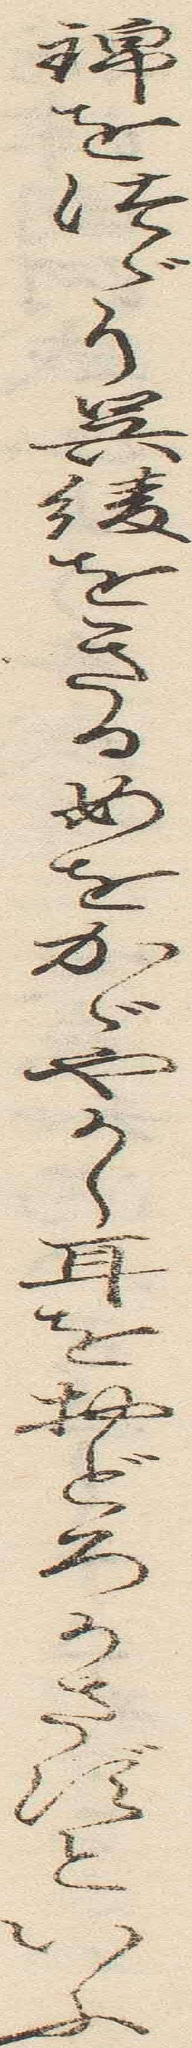錦をつゞり呉綾をきるめをかゞやかし耳をおどろかさずといふ
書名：日光山志
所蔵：東京学芸大学附属図書館 国文学研究資料館
